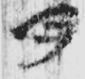月
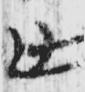甲
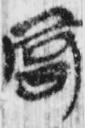晨
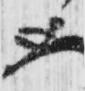之
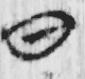日
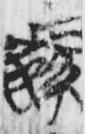繁
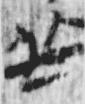丘
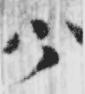少
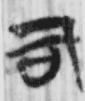司
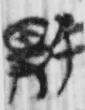敗
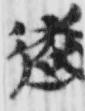遠
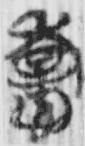悸
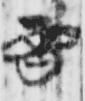言
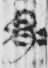{胃刀}（謂）
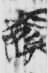繁
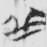丘
